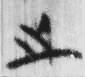之
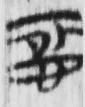恆
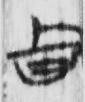貞
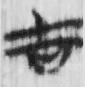吉
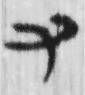又（有）
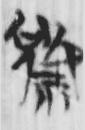○（敓）
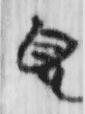見
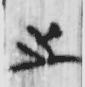之
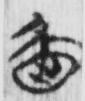○（屈）
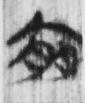宜
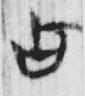占
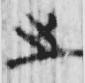之
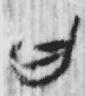曰
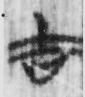吉
